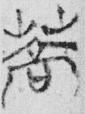蒿（郊）
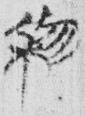利
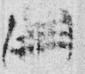用
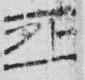○（恒）
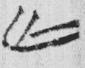亡（无）
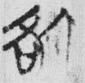咎
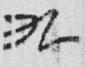九
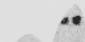二
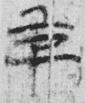○（需）
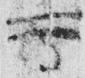于
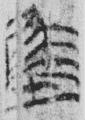○（沙）
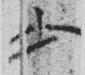少（小）
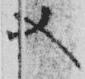又（有）
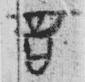言
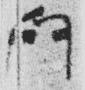夂（終）
